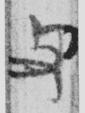○（沒）
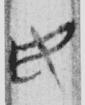女（如）
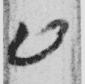㠯
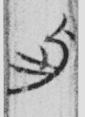此
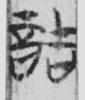詰
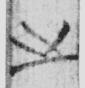之
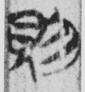則
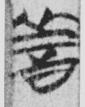善
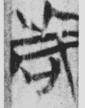者
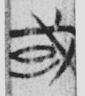或
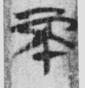不
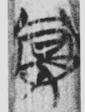賞
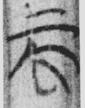而
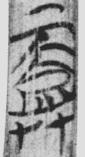暴
